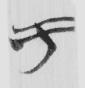于
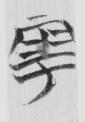𩁹
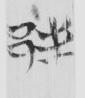邦
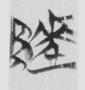{阝來土}
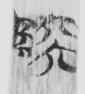{阝六六}
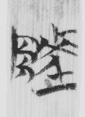{阝來土}
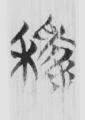{禾爪家}
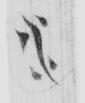水
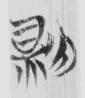則
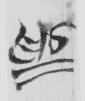爲
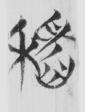稻
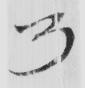乃
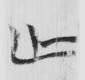亡
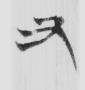又
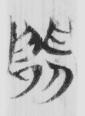{門夕刀}
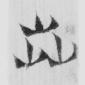卉
